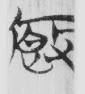{勹㿝攴}
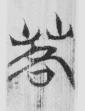茖
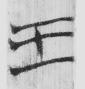王
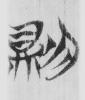則
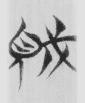{見必}
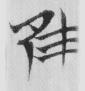隹
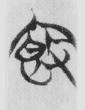{勹㿝攴}
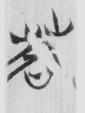茖
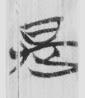是
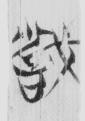{小言戈}
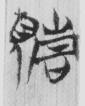{見青}
